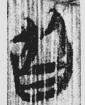皆
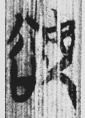○（欲）
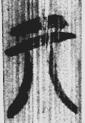亓
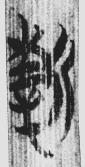新（新）
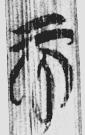而
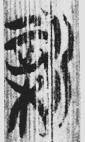新（親）
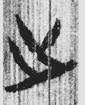之
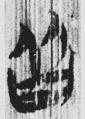皆
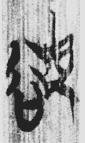欲
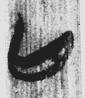㠯
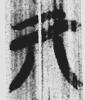亓
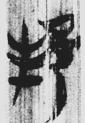邦
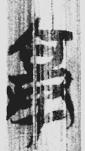○（就）
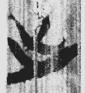之
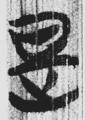是
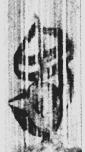胃（謂）
